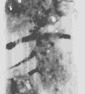方
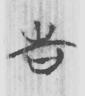告
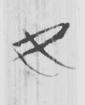女
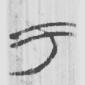于
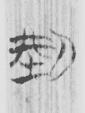型
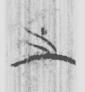之
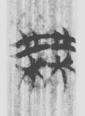無
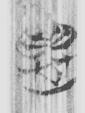𪴿
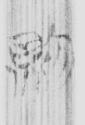則
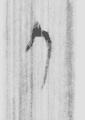人
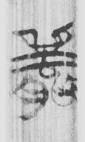{肉襄}
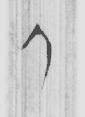人
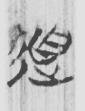道
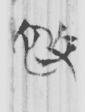{它攴}
